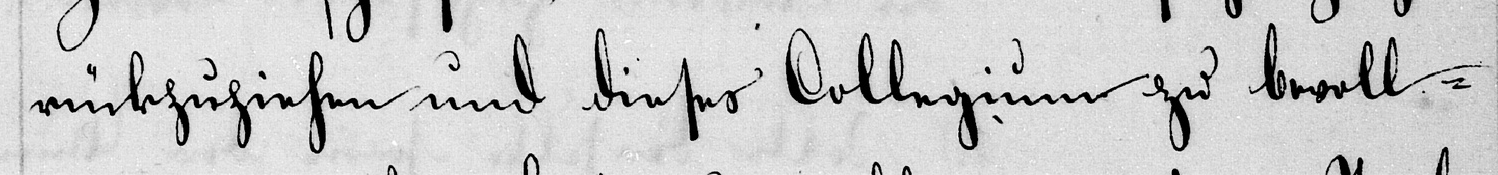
rückzuziehen und dieses Collegium zu bevoll¬
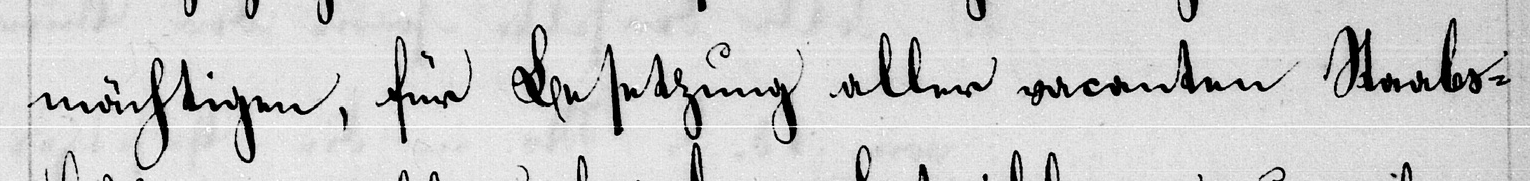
mächtigen, für Besetzung aller vacanten Staab¬
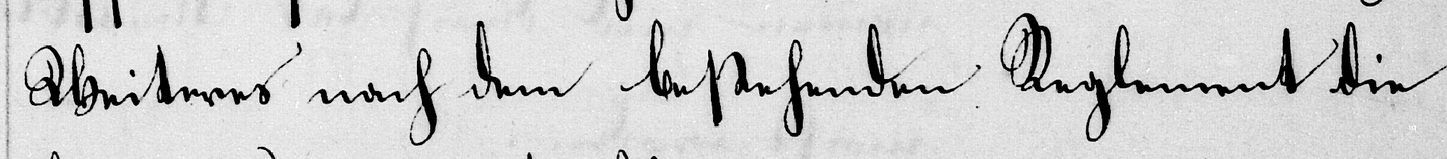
Weiteres nach dem bestehenden Reglement die
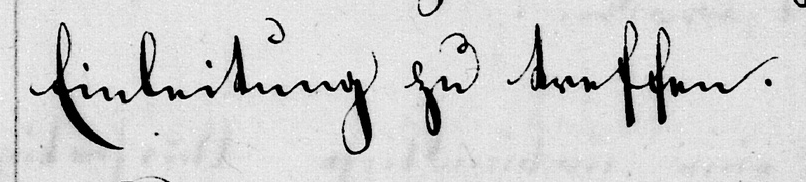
Einleitung zu treffen.
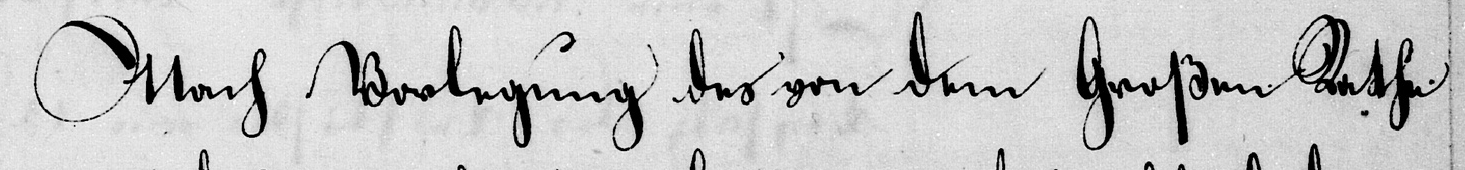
Nach Vorlegung des von dem Großen Rathe
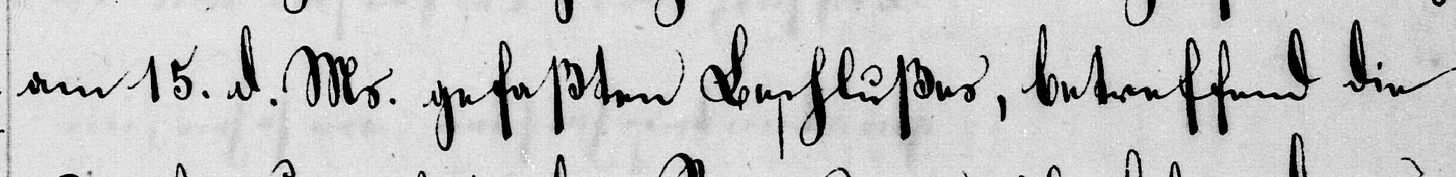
am 15. d. Ms. gefaßten Beschlußes, betreffend die
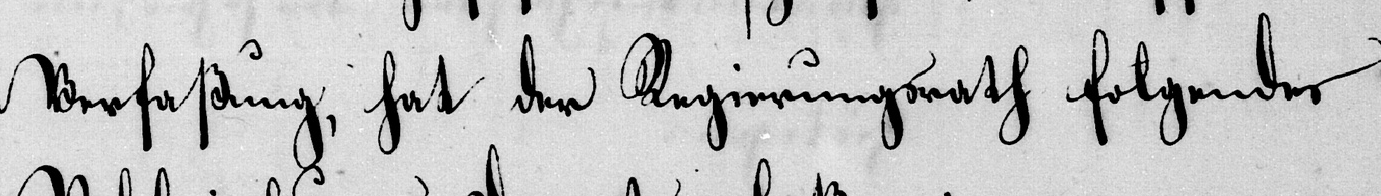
Verfaßung, hat der Regierungsrath folgendes
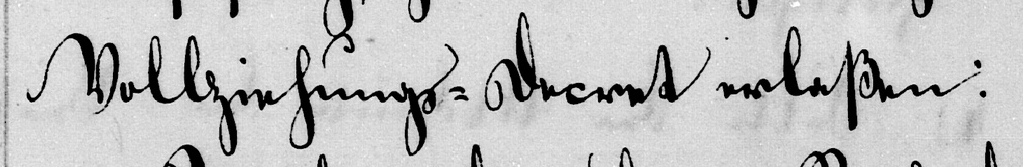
Vollziehungs-Decret erlaßen:
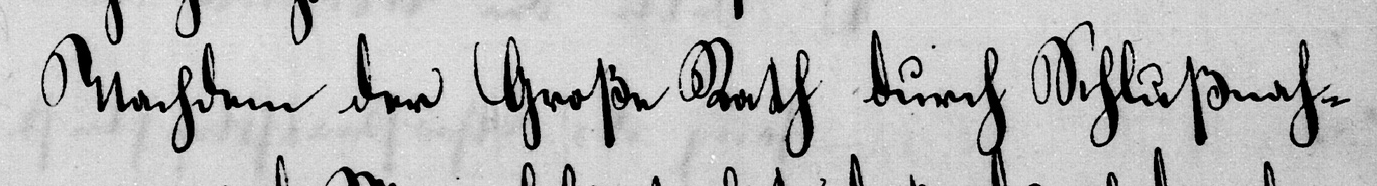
Nachdem der Große Rath durch Schlußnah¬
